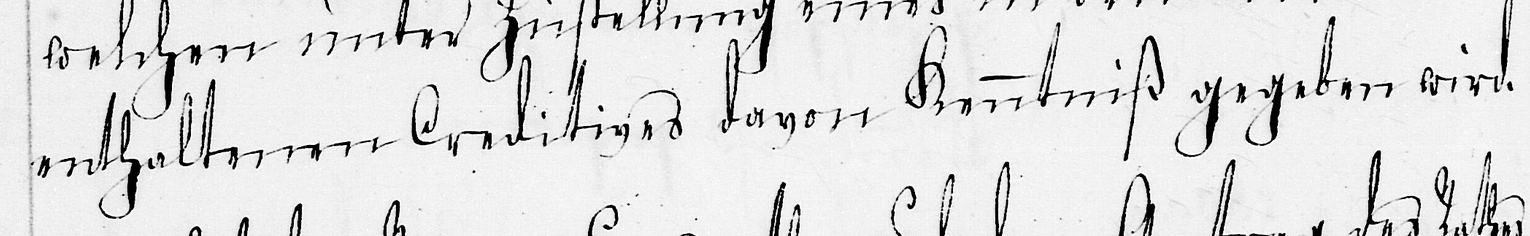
enthaltenen Creditives davon Kenntniß gegeben wird.
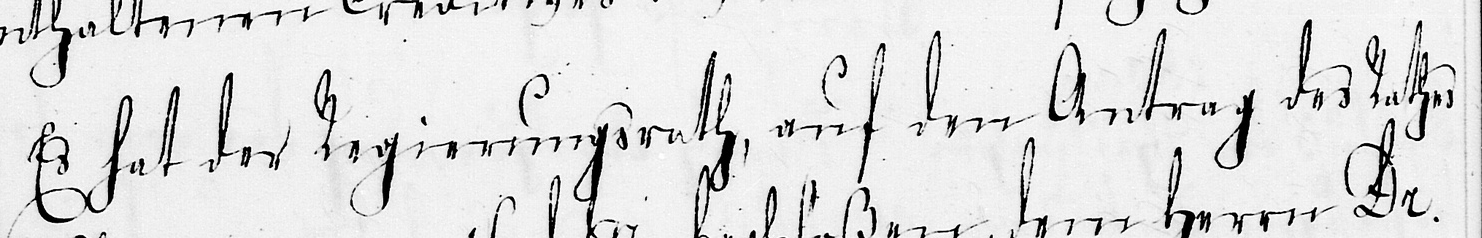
Es hat der Regierungsrath, auf den Antrag des Rath¬
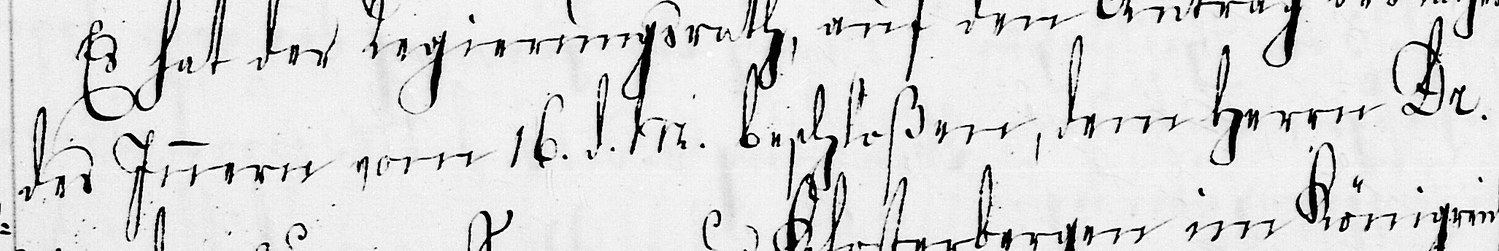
des Innern vom 16. d. M. beschloßen, dem Herrn Dr.
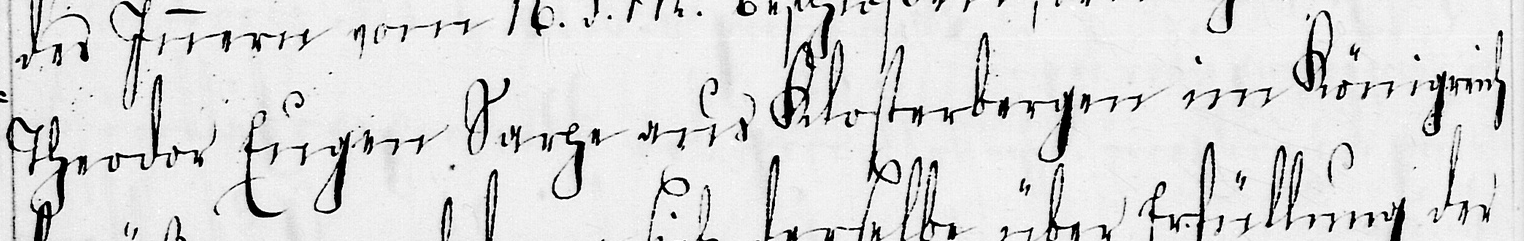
Theodor Eugen Sarge aus Klosterbergen im Königreich
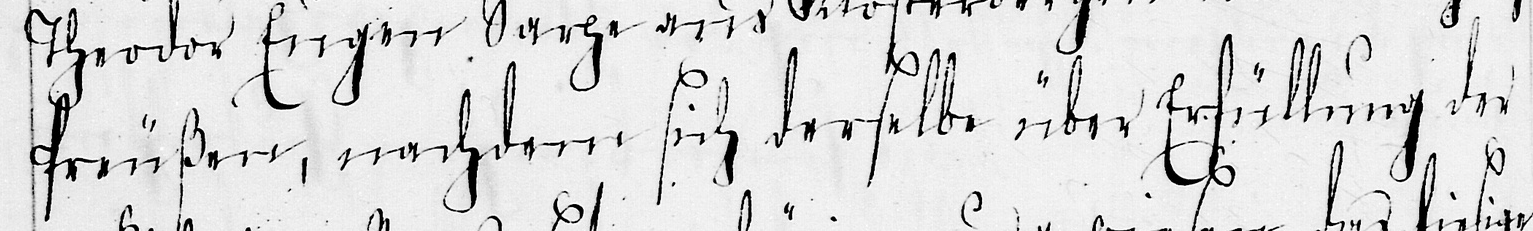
Preußen, nachdem sich derselbe über Erfüllung der
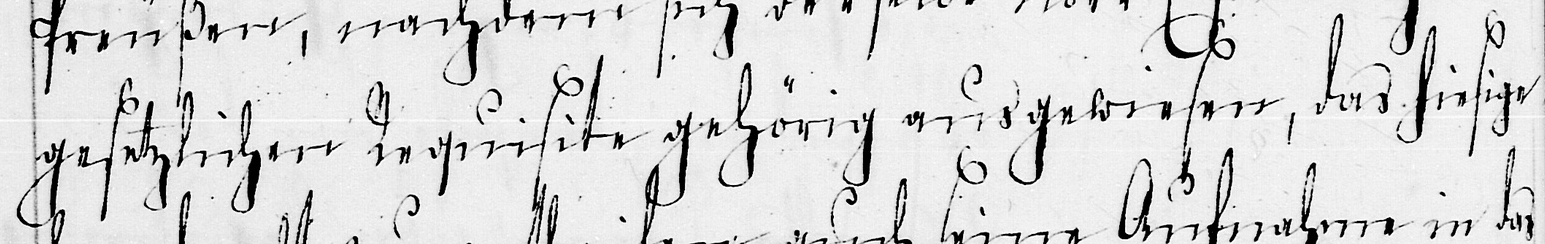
gesetzlichen Requisite gehörig ausgewiesen, das hiesi¬
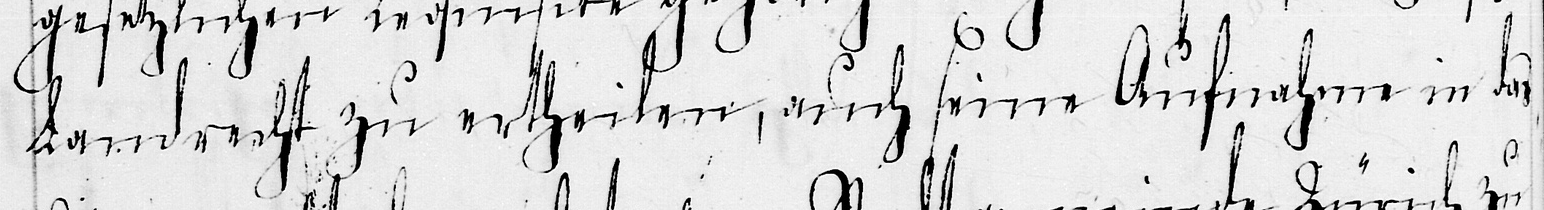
Landrecht zu ertheilen, auch seine Aufnahme in das
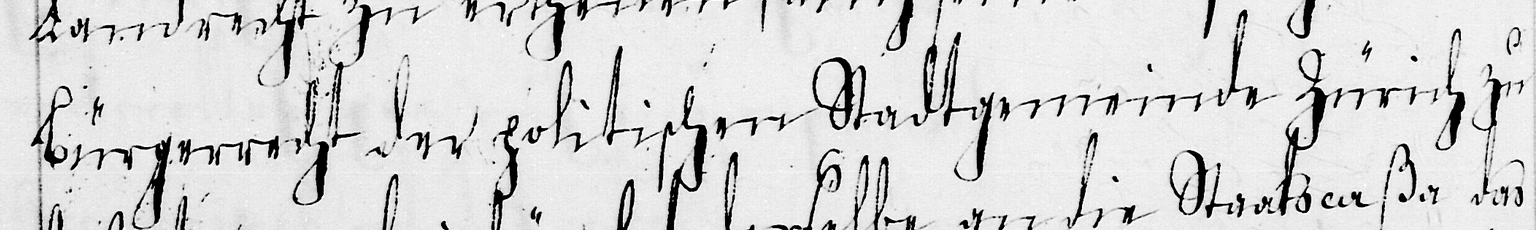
Bürgerrecht der politischen Stadtgemeinde Zürich
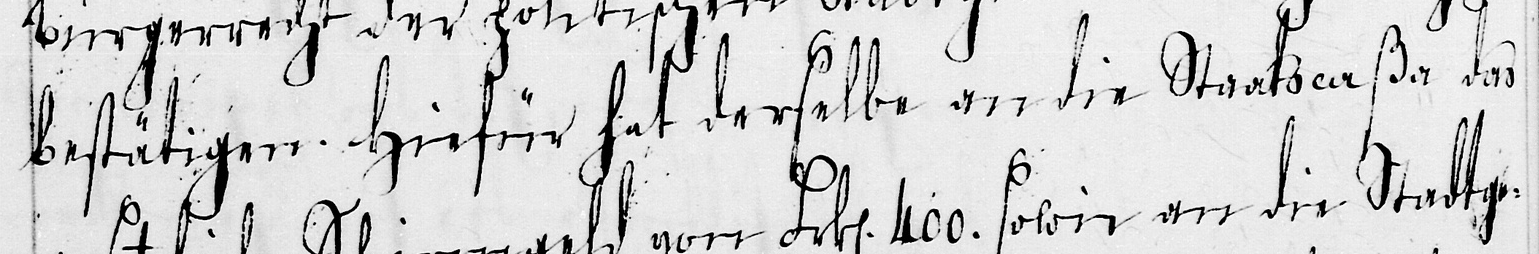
bestätigen. Hiefür hat derselbe an die Staatscaßa das
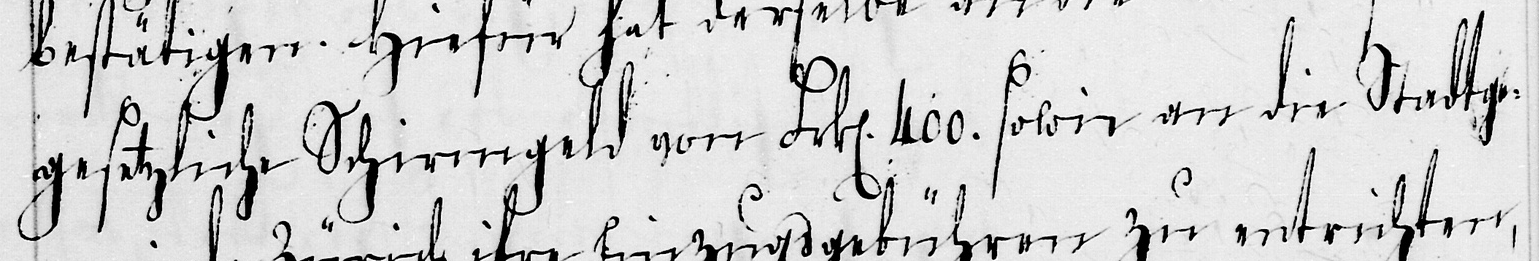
gesetzliche Schirmgeld von Frk[en]. 400. sowie an die Stadtg¬
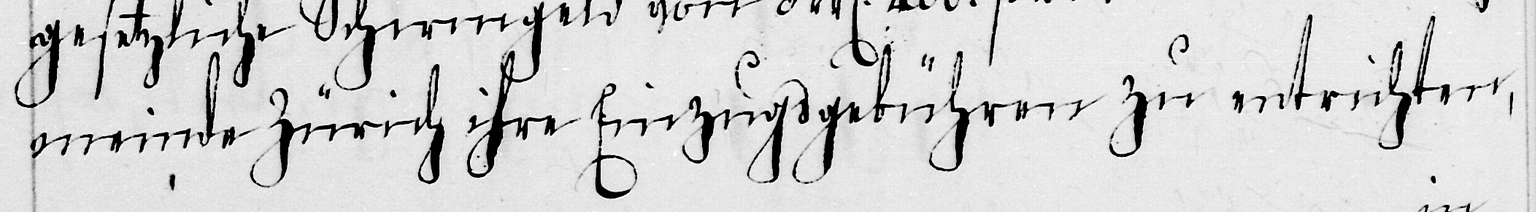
emeinde Zürich ihre Einzugsgebühren zu entrichten,
